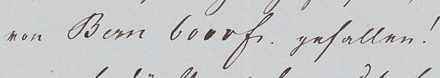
von Bern 6000 Fr. gefallen!
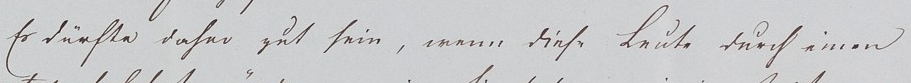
Es dürfte daher gut sein, wenn diese Leute durch einen
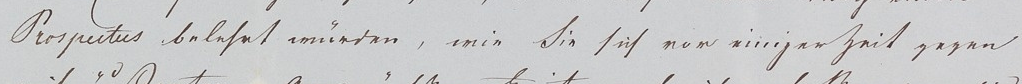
Prospectus belehrt würden, wie Sie sich vor einiger Zeit gegen
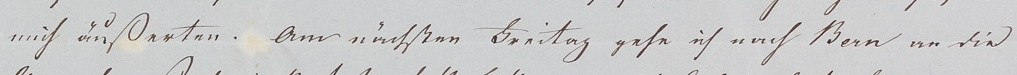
mich äußerten. Am nächsten Freitag gehe ich nach Bern an die
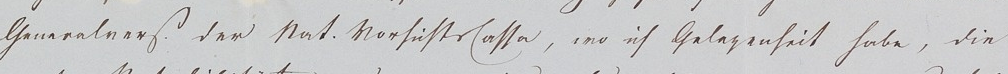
Generalvers. der Nat. Vorsichts Cassa, wo ich Gelegenheit habe, die
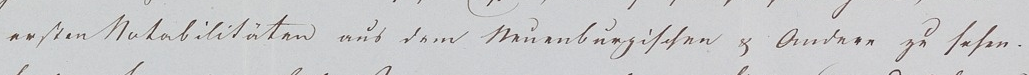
ersten Notabilitäten aus dem Neuenburgischen & Andern zu sehen.
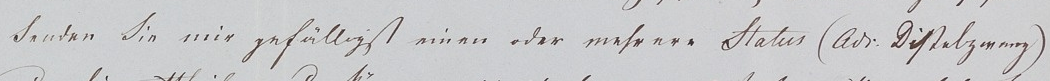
Senden Sie mir gefälligst einen oder mehrere Status (Adr. Distelzwerg)
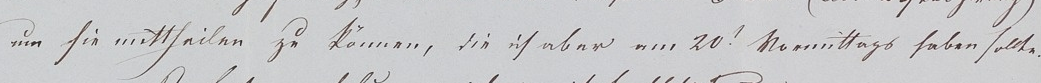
um sie mittheilen zu können, die ich aber am 20t Vormittags haben sollte.
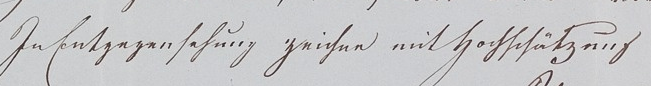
In Entgegensehung zeichne mit Hochschätzung
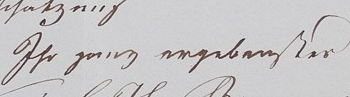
Ihr ganz ergebenster
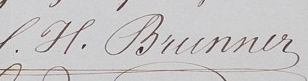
C. H. Brunner
